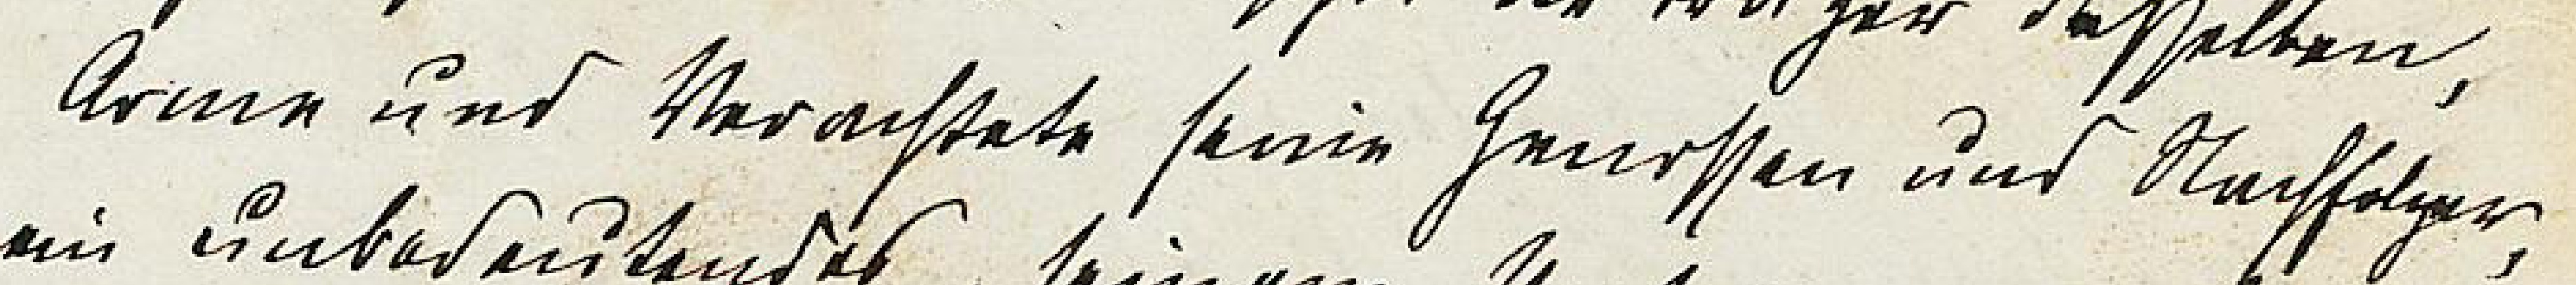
Arme und Verachtete seine Genossen und Nachfolger,
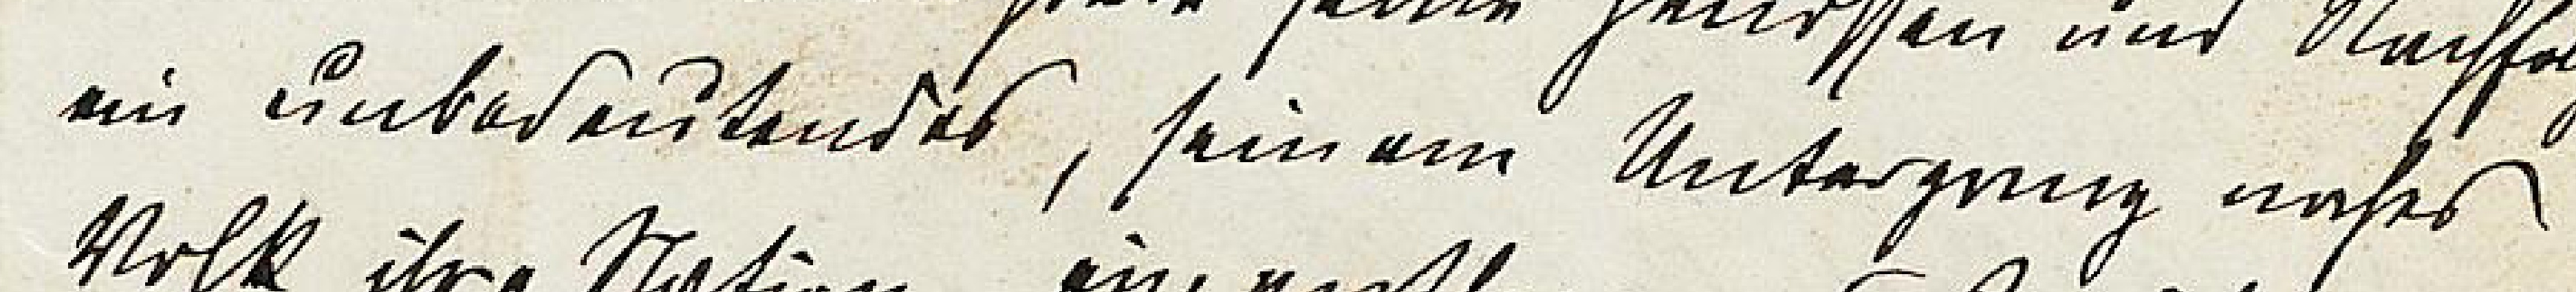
ein unbedeutendes, seinem Untergang nahes
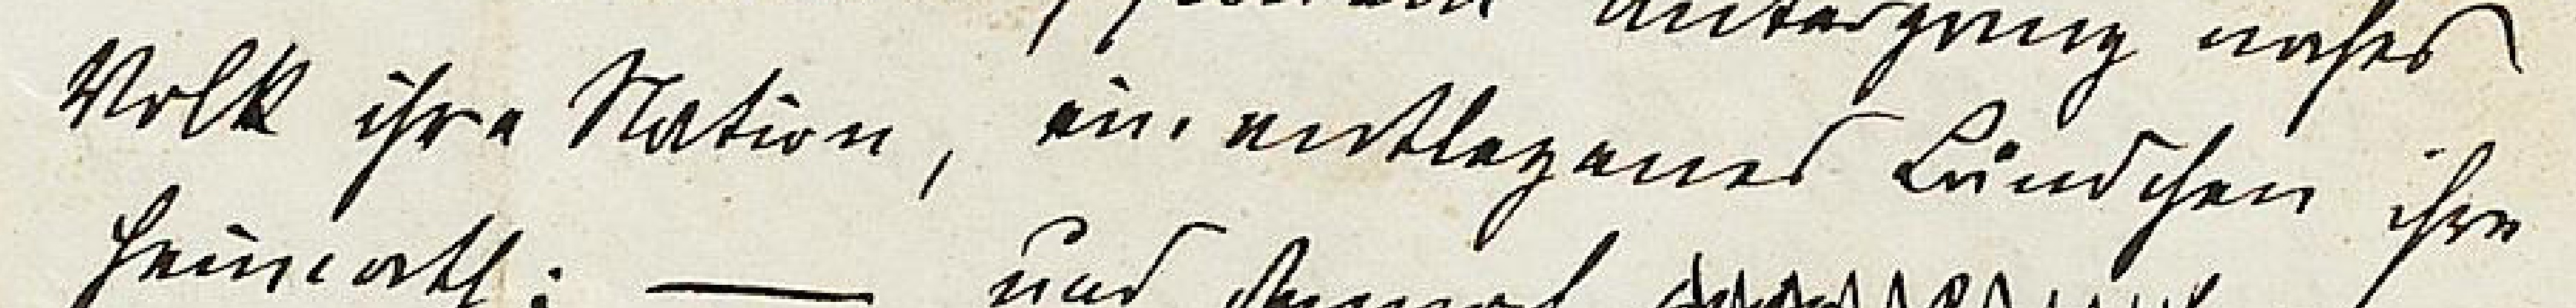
Volk ihre Nation, ein entlegenes Lädchen ihre
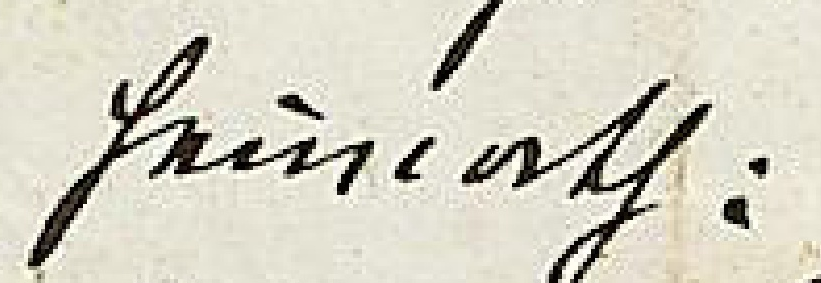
Heimath:
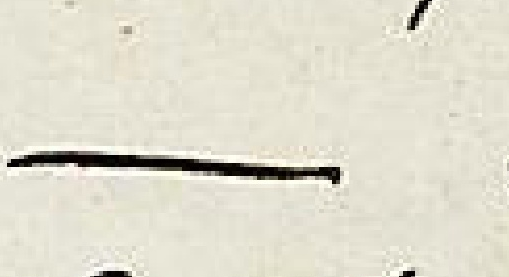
_
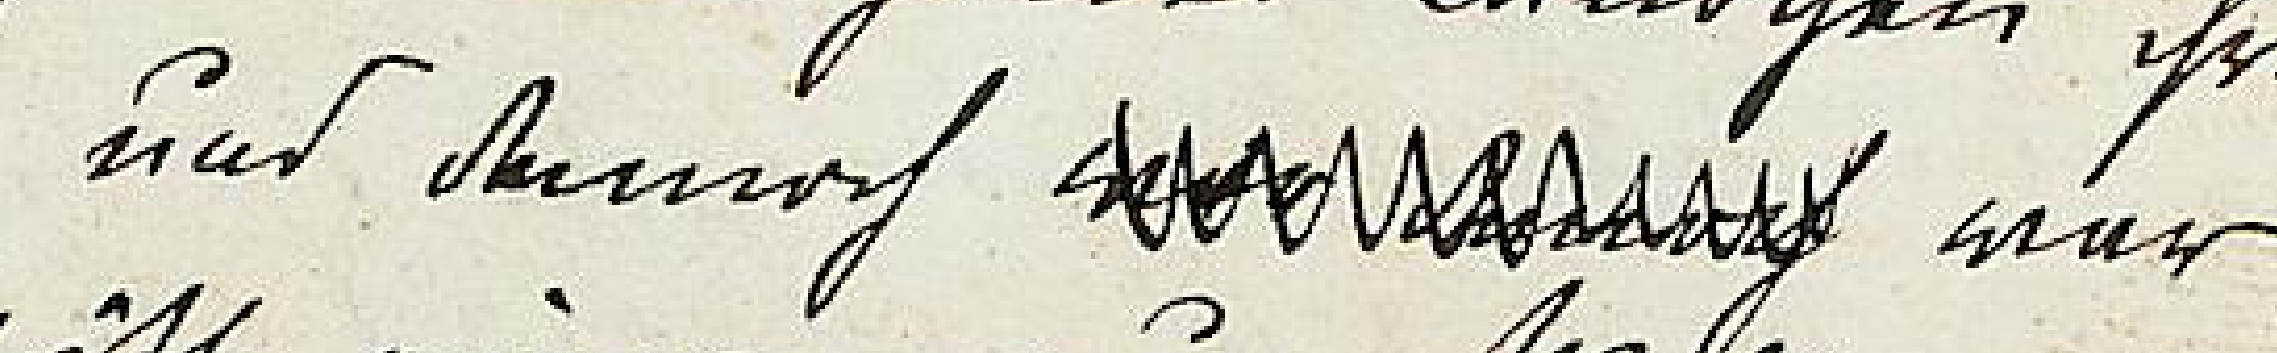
und dennoch war Bereich war
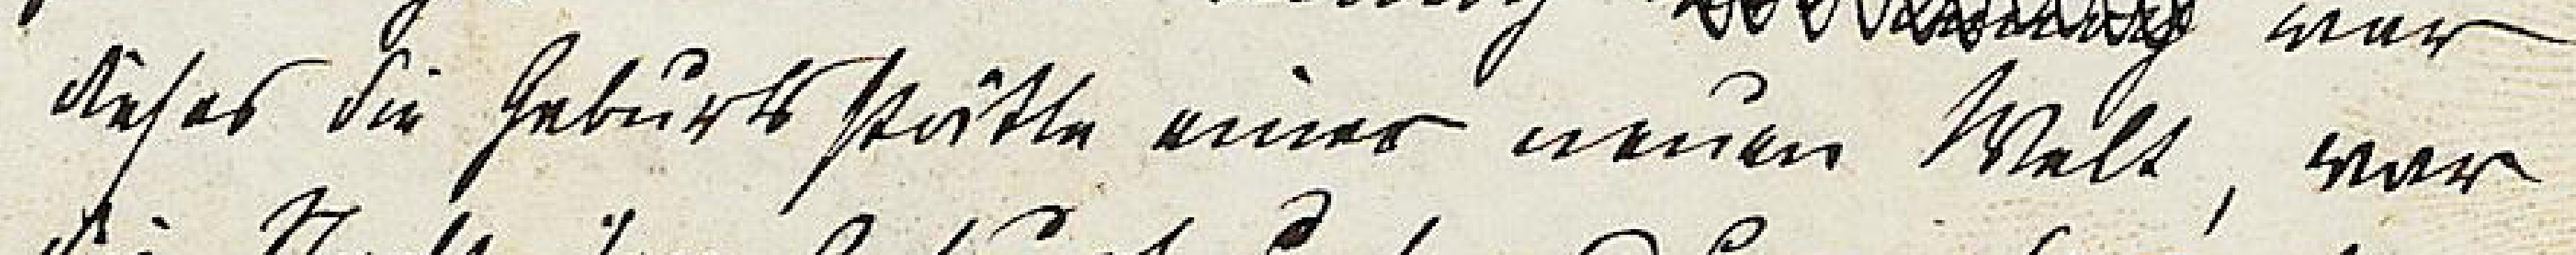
dieses die Geburtsstätte einer neuen Welt, war
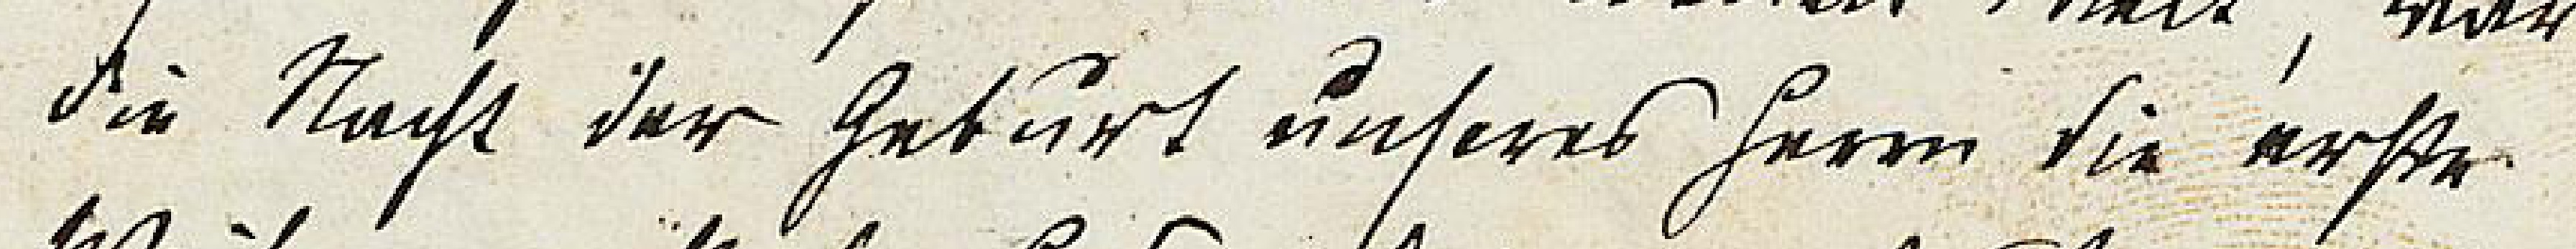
die Nacht der Geburt unseres Herrn die erste
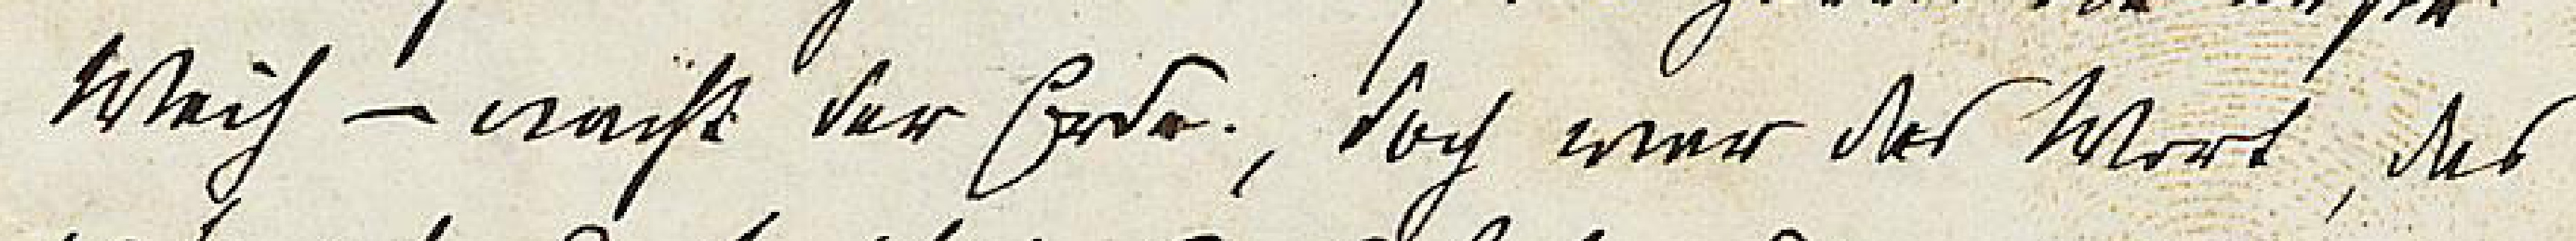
Weih-nacht der Erde, doch war das Wort, das
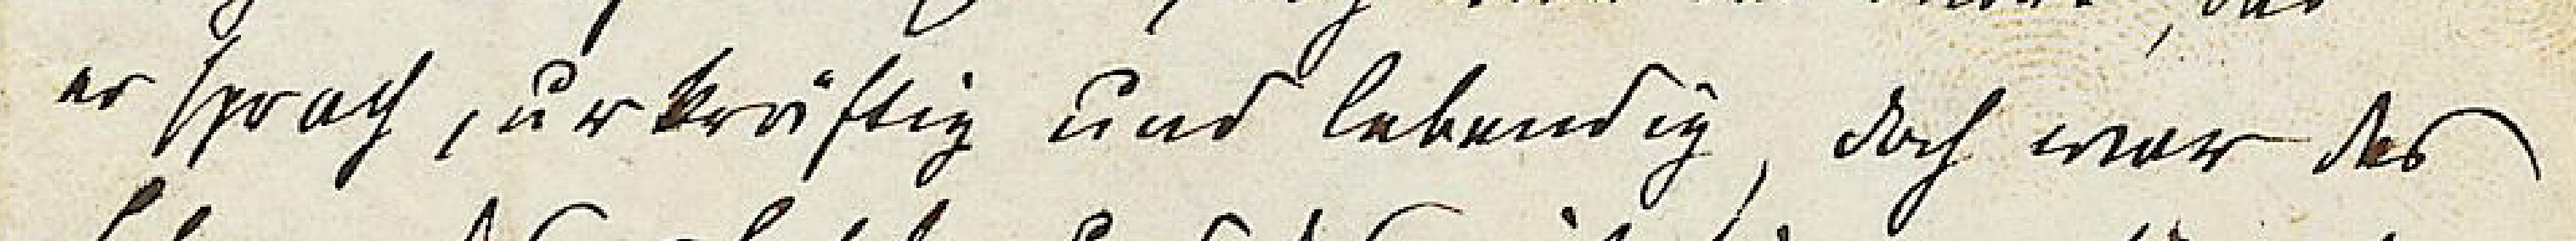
er sprach, urkräftig und lebendig, doch war das
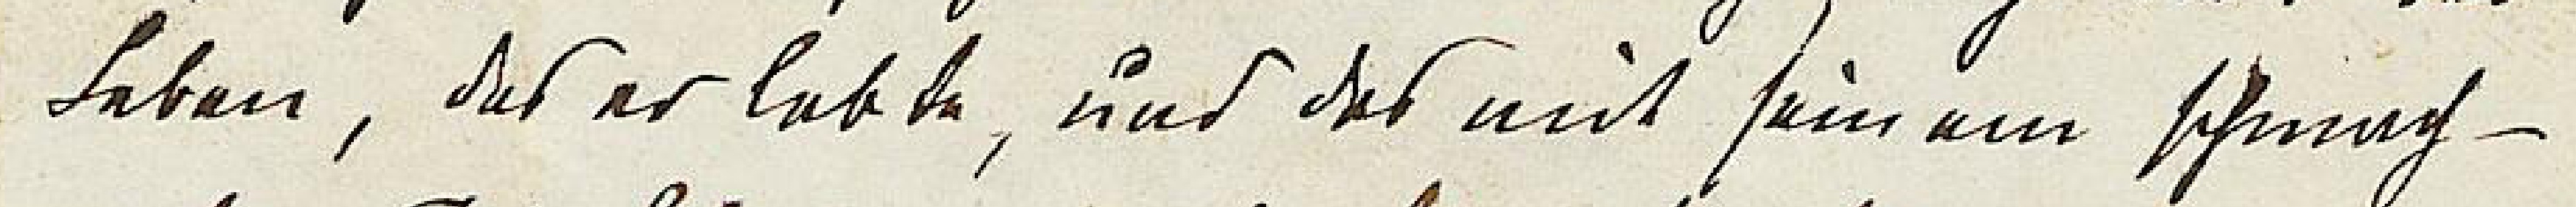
Leben, das er lebte, und das mit seinem schmach¬
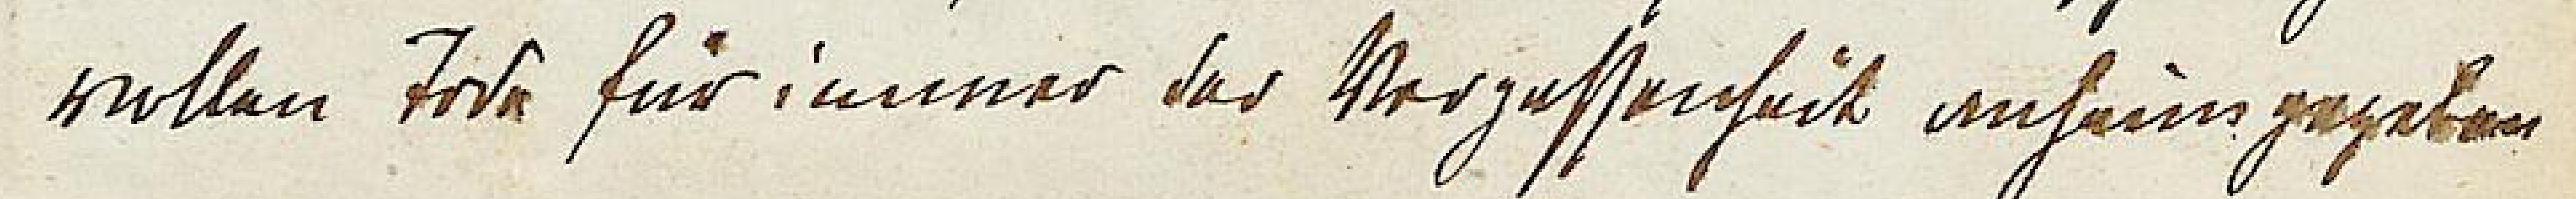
vollen Tode für immer der Vergessenheit anheimgegeben
